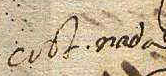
cust. nada
